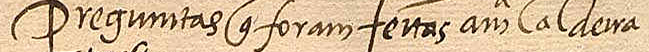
Pregumtas q̅ foram feitas a ma Caldeira
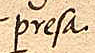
presa.
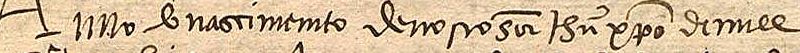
Anno do nascimemto de nosso s̄or Jhu̅ xp̅o de mill
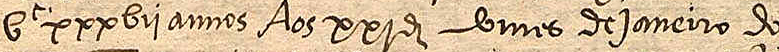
bc xxxbij annos Aos xxj d̄ do mes de Janeiro do
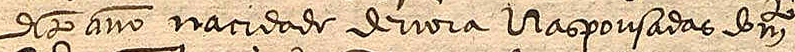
dit̅o a̅no na çidade deuora Nas pousadas do mto
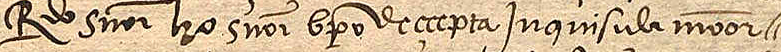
Rdo Sn̅or ho snōr bp̅o de çcepta Jnquisidor m̅oor //
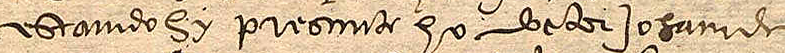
estamdo hy presemte ho doctor Joham de
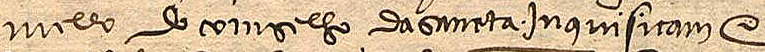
mello do comselho da sancta Jnquisicam e
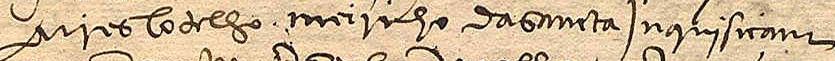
Aires botelho meirinho da sancta Jnqujsiçam
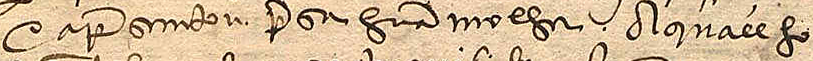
e ap̄semtou p̄sa hu̅a molher. A quall ho
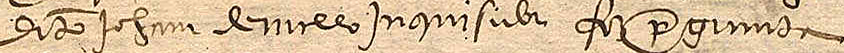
dit̅o Joham de mello Jnquisidor fez p̄gumta
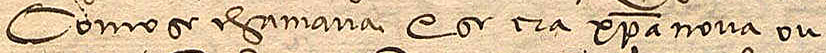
Como se chamaua e se era x̅pa noua ou
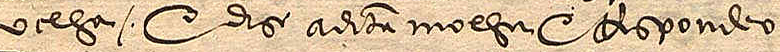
velha /. e dise a dit̅a molher e Respondeo
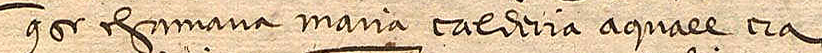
q̅ se chamaua maria caldeira a quall era
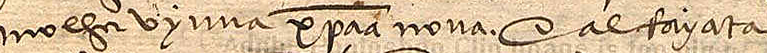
molher vyuua x̅paa noua. e alfayata
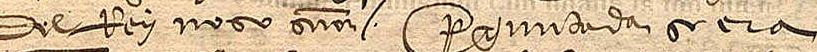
del Rey noso s̅nor/. p̄guntada se era
